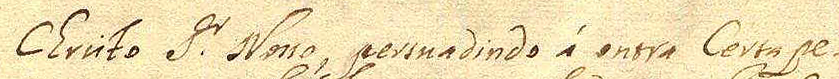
Christo s.or Nosso, persuadindo á outra Certa pe
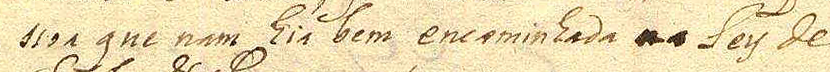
ssoa que nam hia bem encaminhada na Ley de
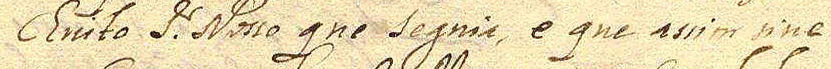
Christo S.r Nosso que seguia, e que assim tiue
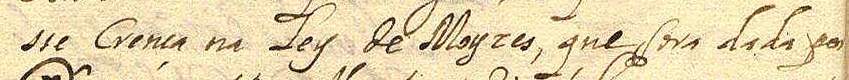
sse Crença na Ley de Moyzes, que fora dada por
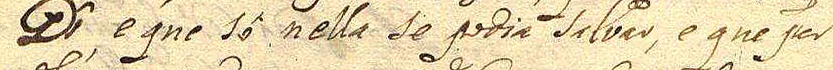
Ds̄, e que só nella se podia salvar, e que per
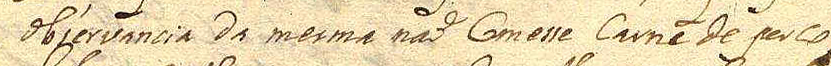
observancia da mesma naõ Comesse Carne de porco
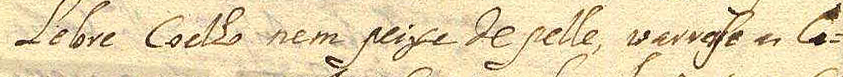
Lebre Coelho nem peixe de pelle, varresse as Ca
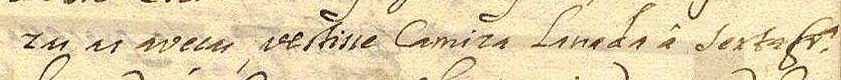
zas as aveças, vestisse Camiza lauada á sexta fr.a
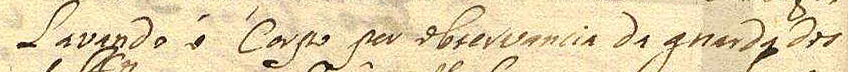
Lavando o Corpo per observancia da guarda dos
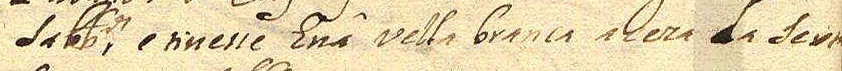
sabb.os e tiuesse huā vella branca aceza da sext
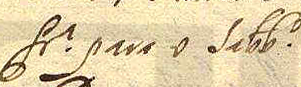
fr.a para o sabb.o
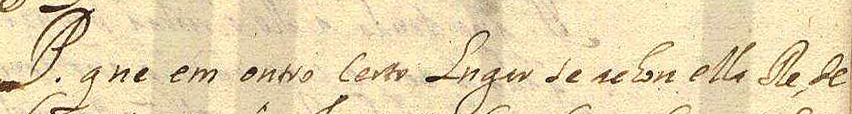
P. que em outro certo Lugar se achou ella Re, de
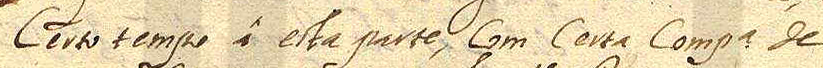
Certo tempo á esta parte, com Certa Comp.a de
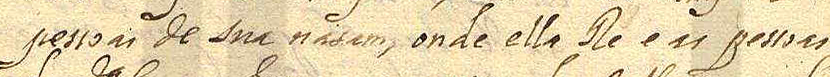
pessoas de sua nasam, onde ella Re e as pessoas
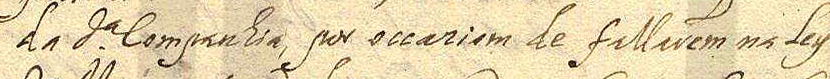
da d.a Companhia, por occaziam de fallarem na Ley
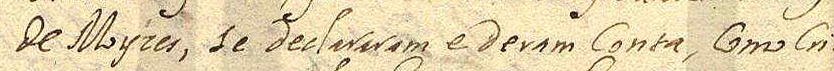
de Moyzes, se declararam e deram Conta, Como Cri
